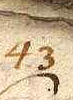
43
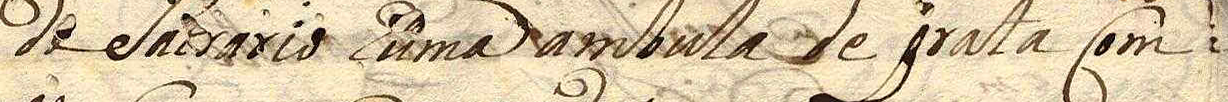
do Sacrario huma ambula de prata Com
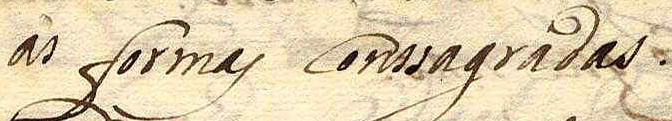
as formas conssagradas.
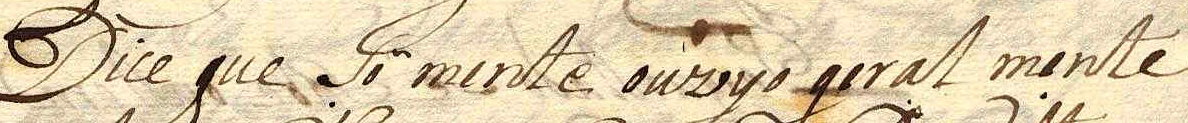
Dice que sómente ouvyo geralmente
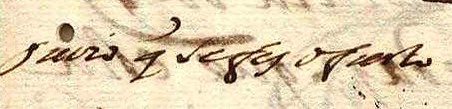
juizo q̄ se fes o furto
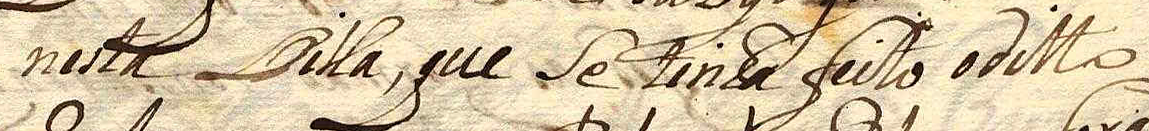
nesta Villa, que se tinha feito o ditto
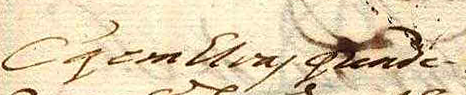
E q̄ em Elvas prende
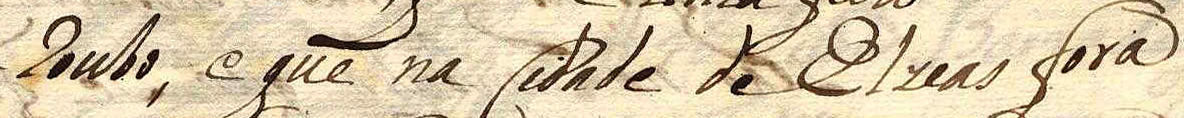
Roubo e que na Cidade de Elvas fora
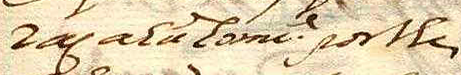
raõ a hū homē. por lhe
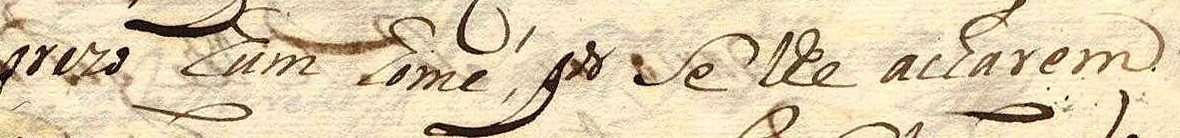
prezo hum homē por se lhe acharem
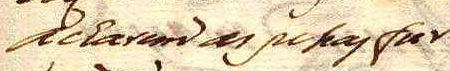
acharem as pessas fur
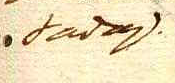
tadas.
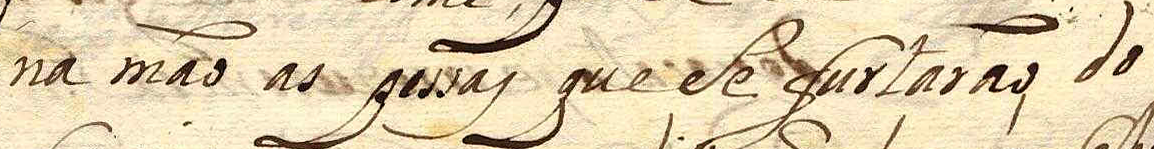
na maõ as pessas que se furtaraõ, do
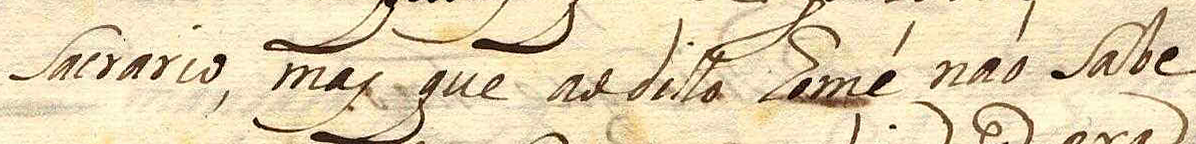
Sacrario, mas que ao ditto homē naõ sabe
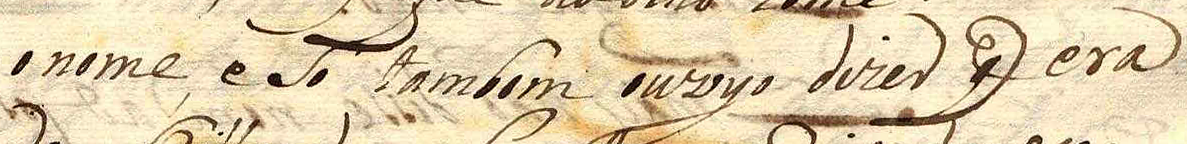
o nome, e só tambem ouvyo dizer q̄ era
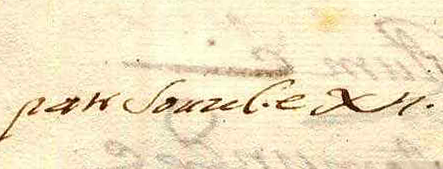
patr Souzel e x n.
